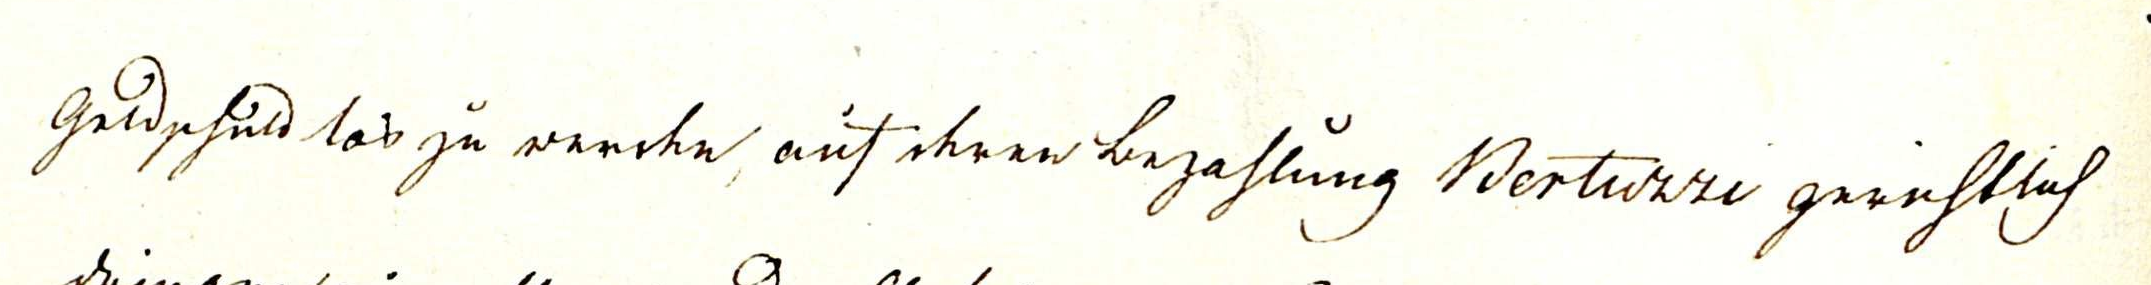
Geldschuld lost zu werden, auf deren Bezahlung Bertuzzi gerichtlich
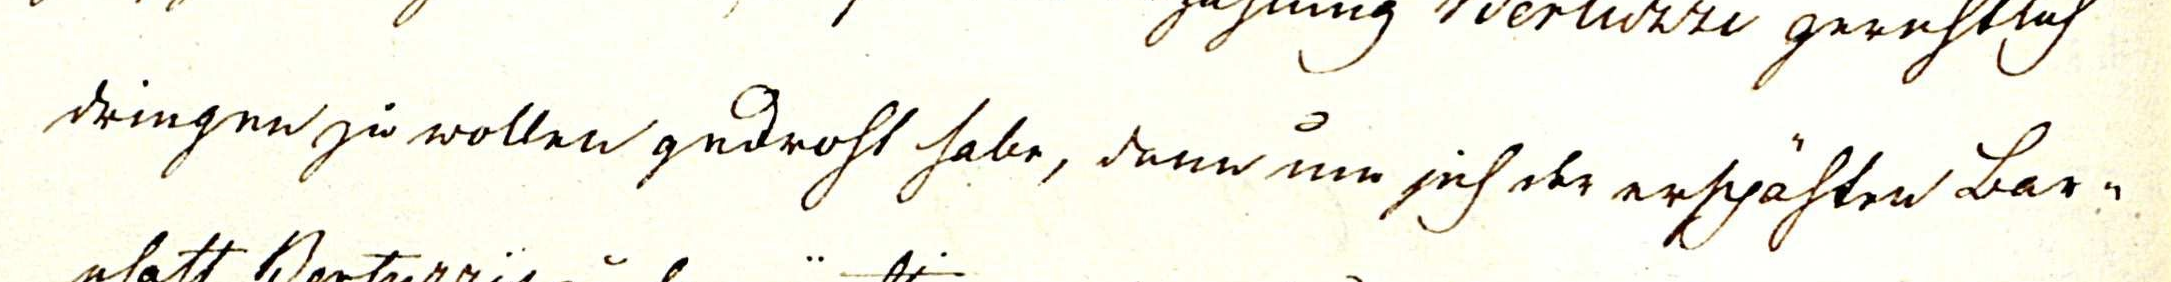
dringen zu wollen gedroht habe, dann um sich der erspähten Bar¬
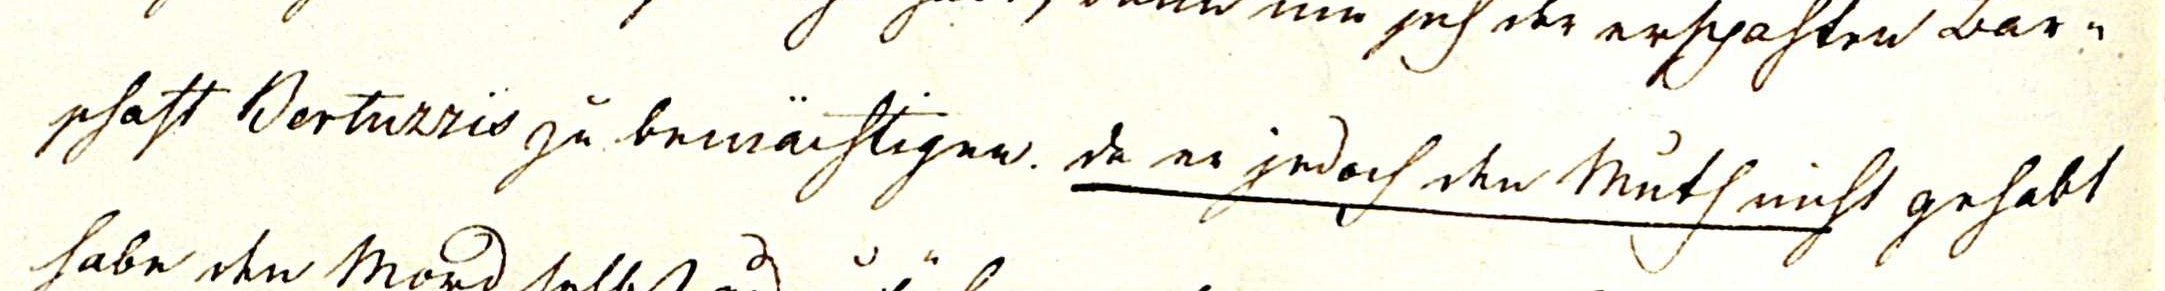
schaft Bertuzzis zu bemächtigen. Da er jedoch den Muth nicht gehabt
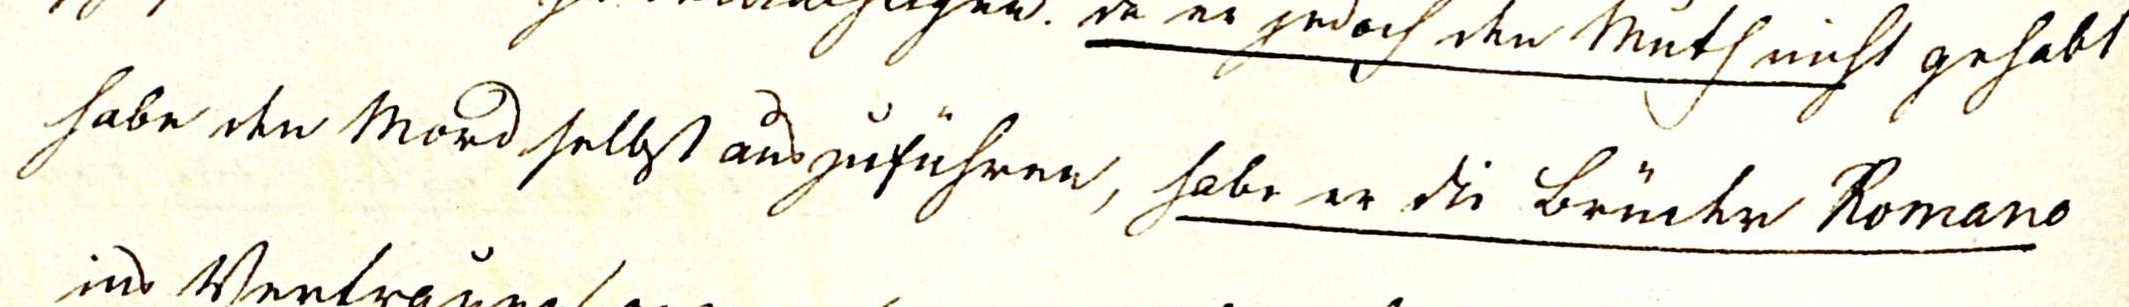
habe den Mord selbst auszuführen, habe er die Brüder Romano
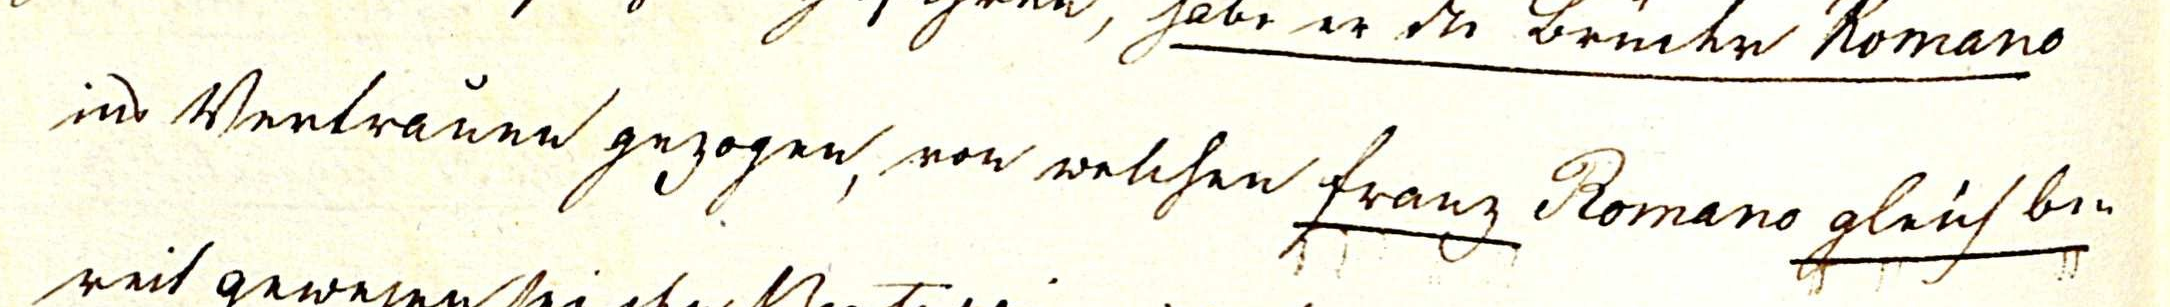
ins Vertrauen gezogen, von welchen Franz Romano gleich be¬
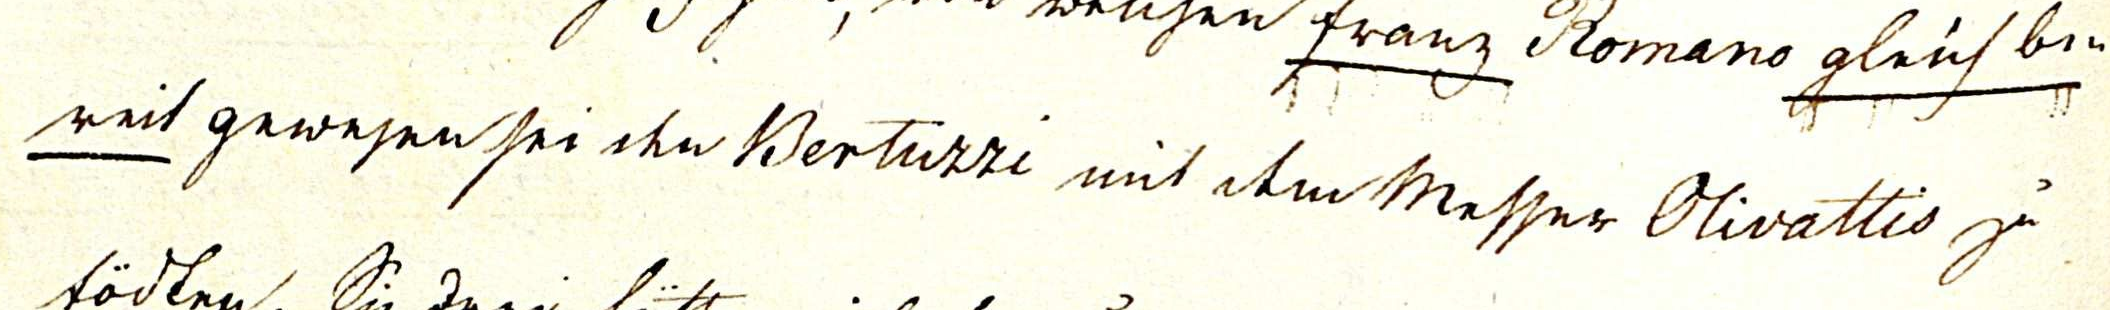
reit gewesen seit den Bertuzzi mit dem Messer Olivattis zu
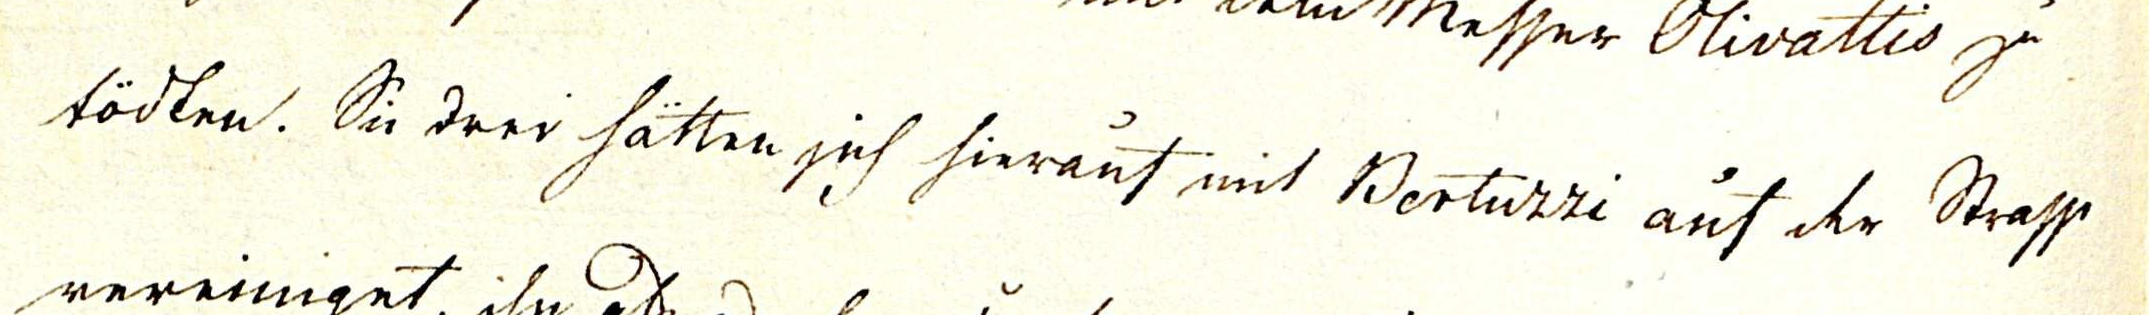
tödten. Sie drei hätten sich hierauf mit Bertuzzi auf der Strasse
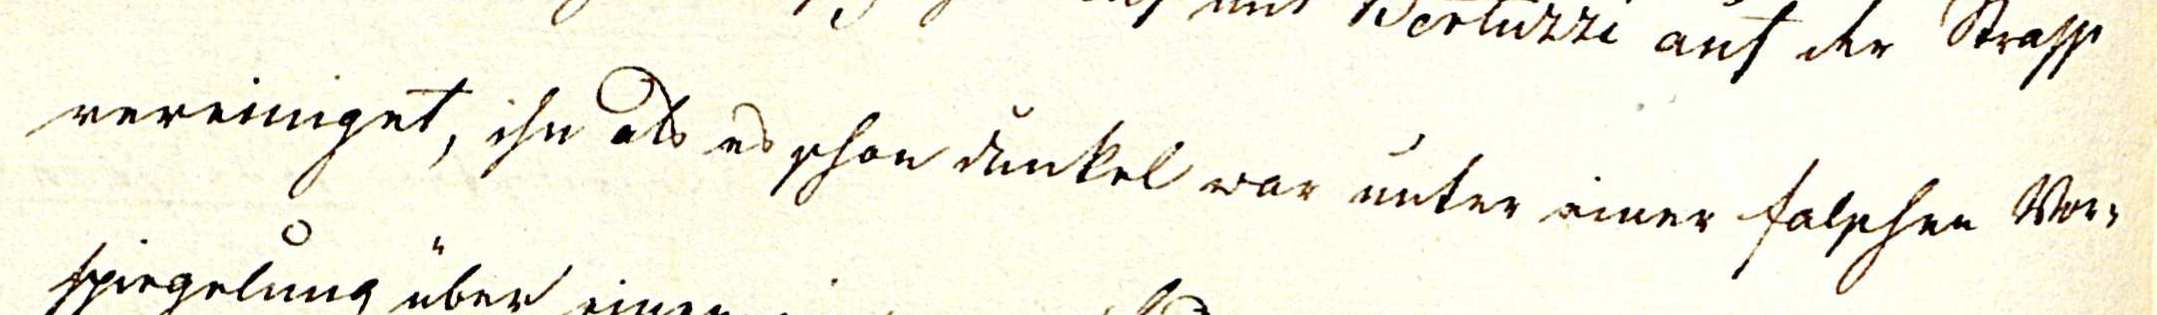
vereiniget, ihn als es schon dunkel war unter einer falschen Ver¬
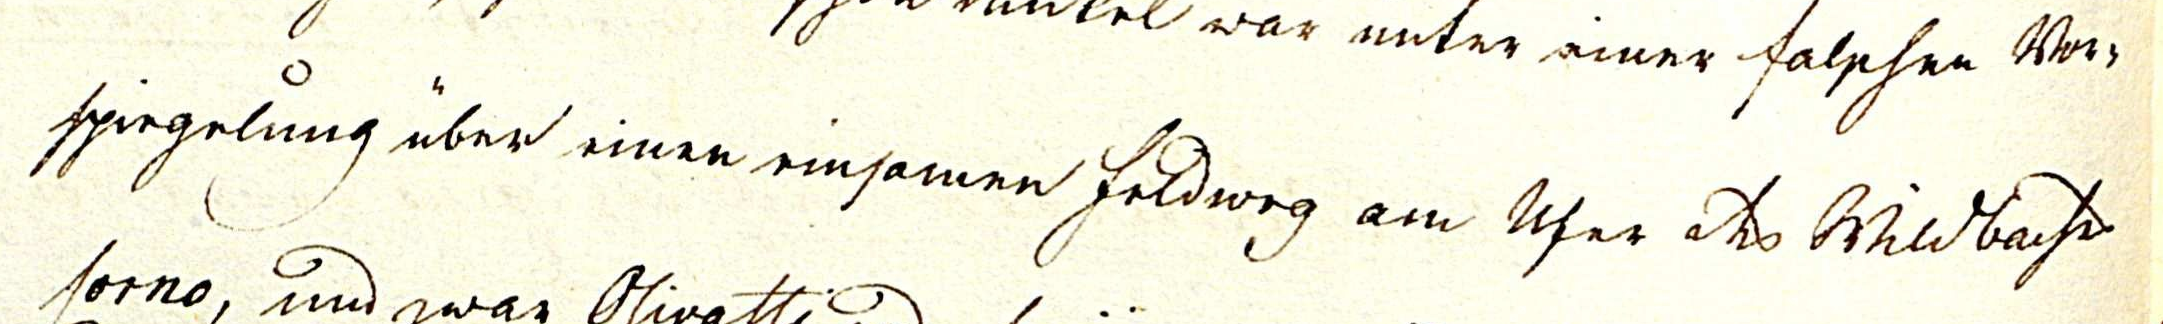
spiegelung über einen einsamen Feldweg am Ufer des Wildbaches
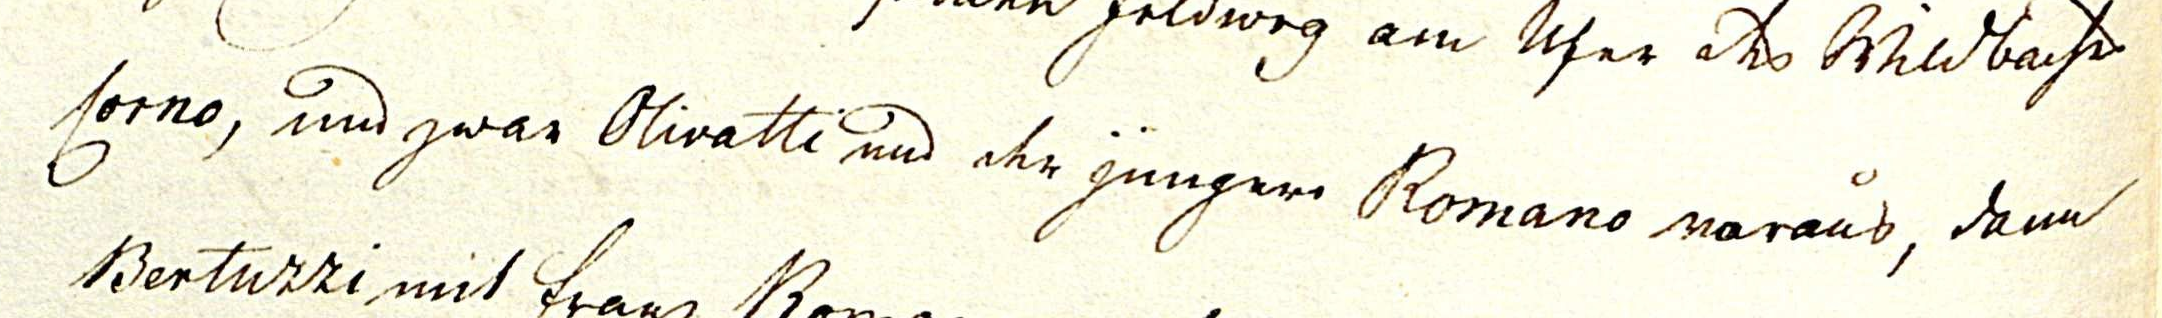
Forno, und zwar Olivatti und der jüngere Romano voraus, dann
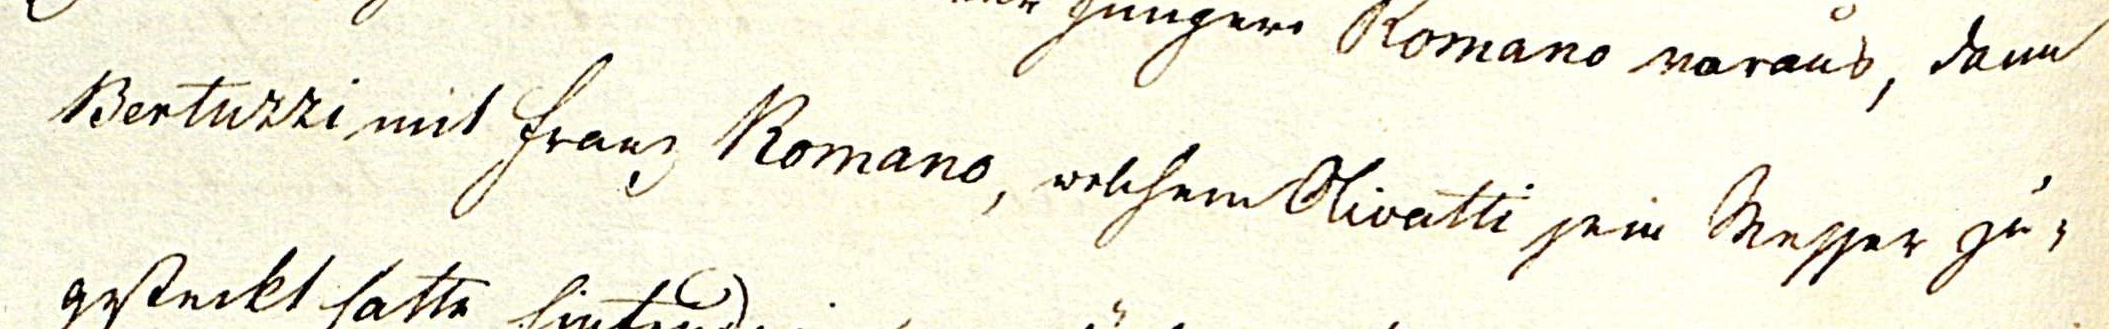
Bertuzzi mit Franz Romano, welchem Olivatti sein Messer zu¬
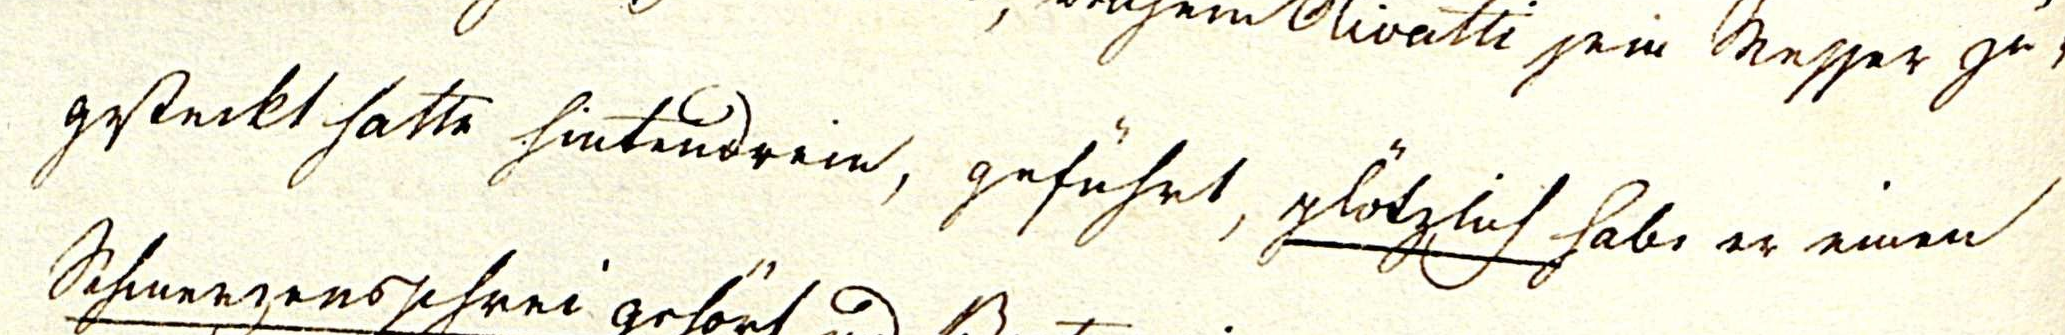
gesteckt hatte hintendrein, geführt, plötzlich habe er einen
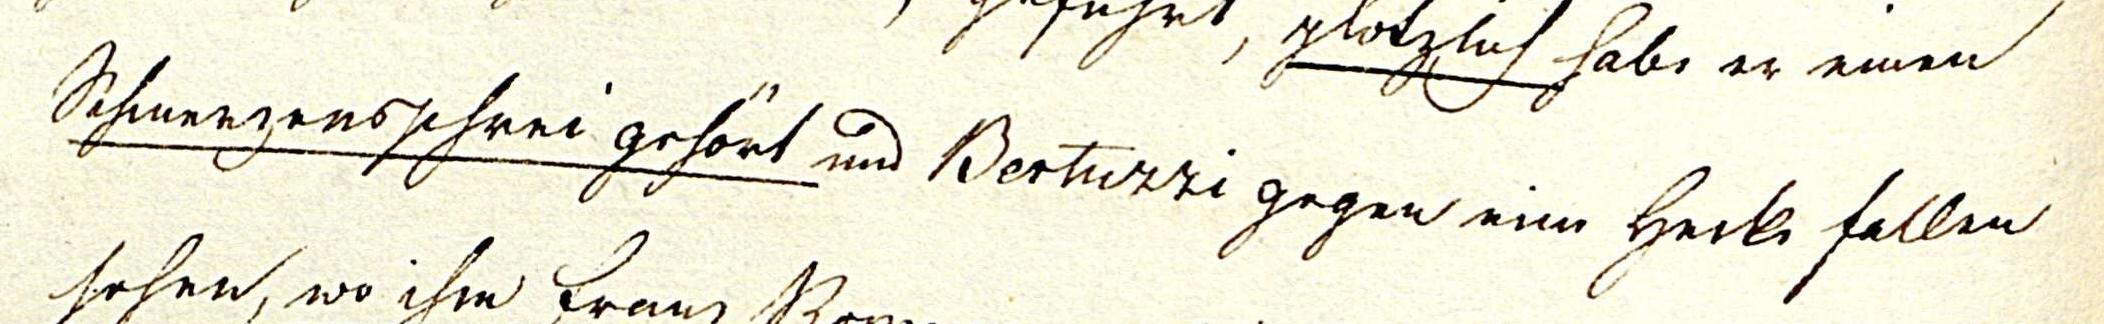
Schmerzensschrei gehört und Bertuzzi gegen eine Hacke fallen
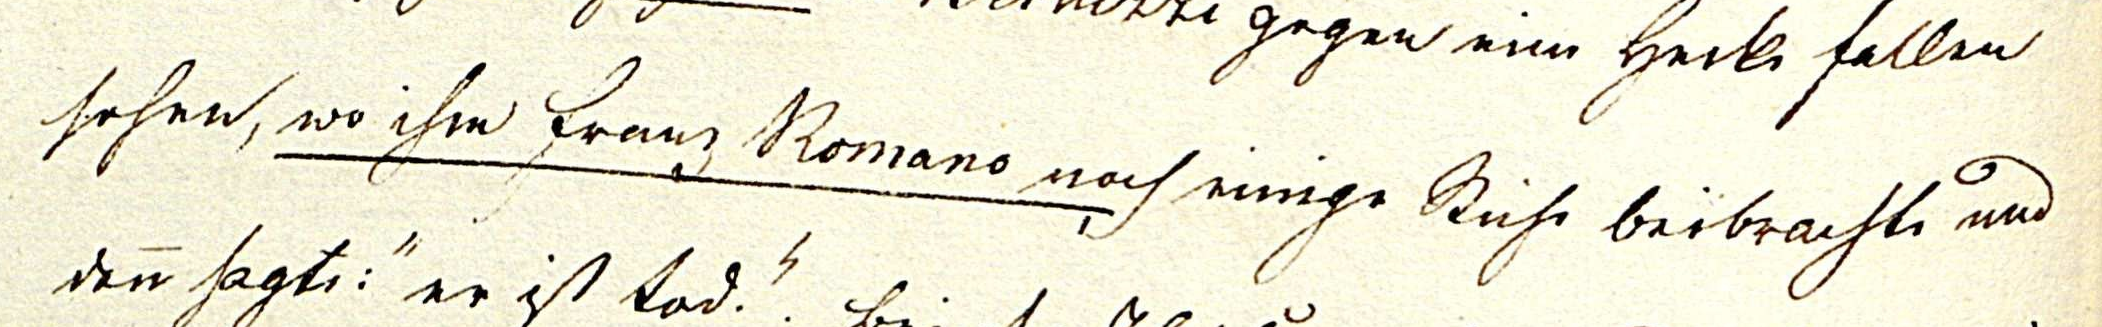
sehen, wo ihm Franz Romano noch einige Stiche beibrachte und
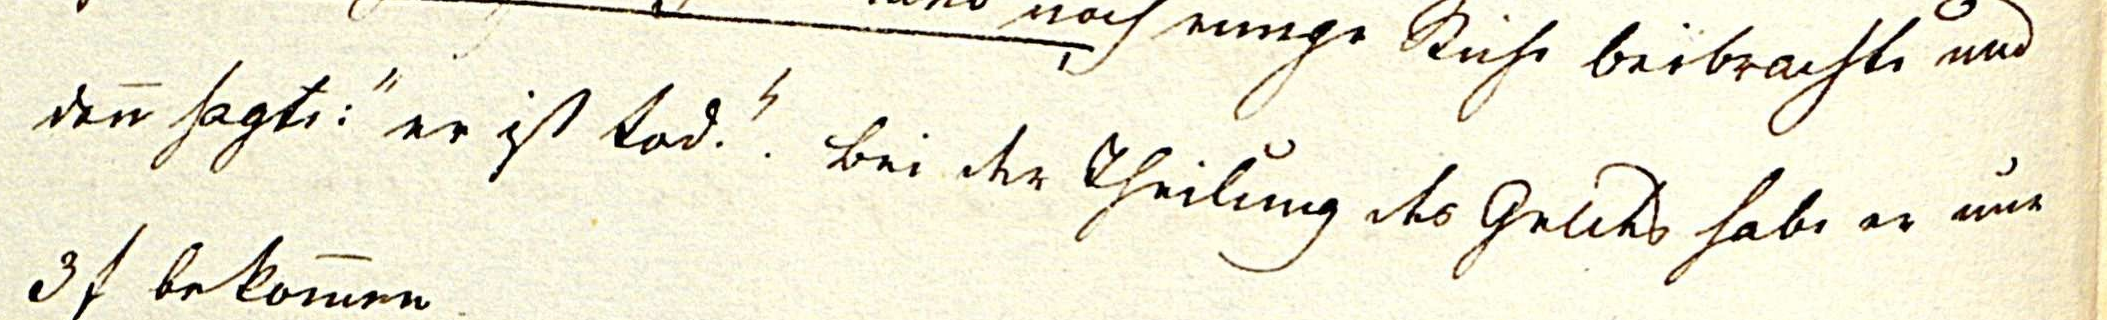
denn sagte: „er ist tod.“ Bei der Theilung des Geldes habe er nun
